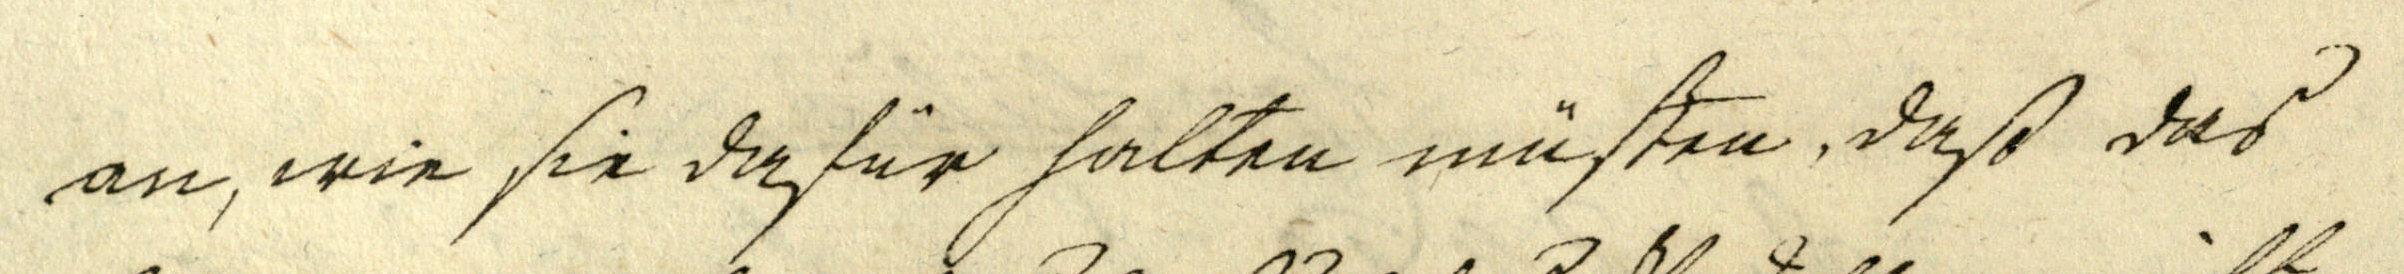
an, wie sie dafür halten müßten, daß das
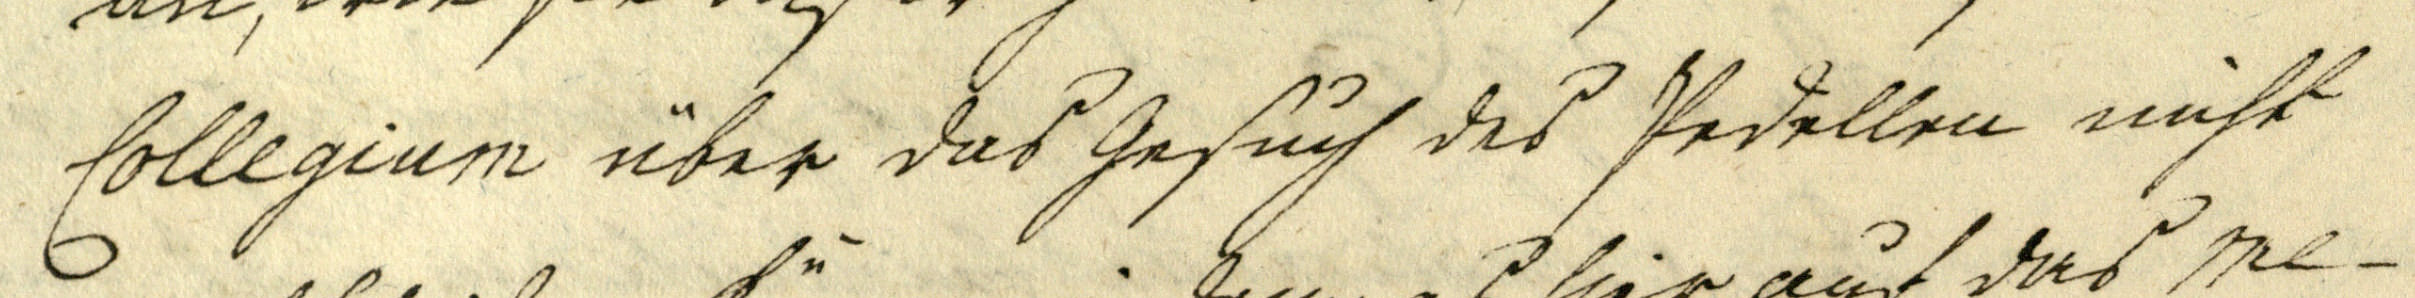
Collegium über das Gesuch des Pedellen nicht
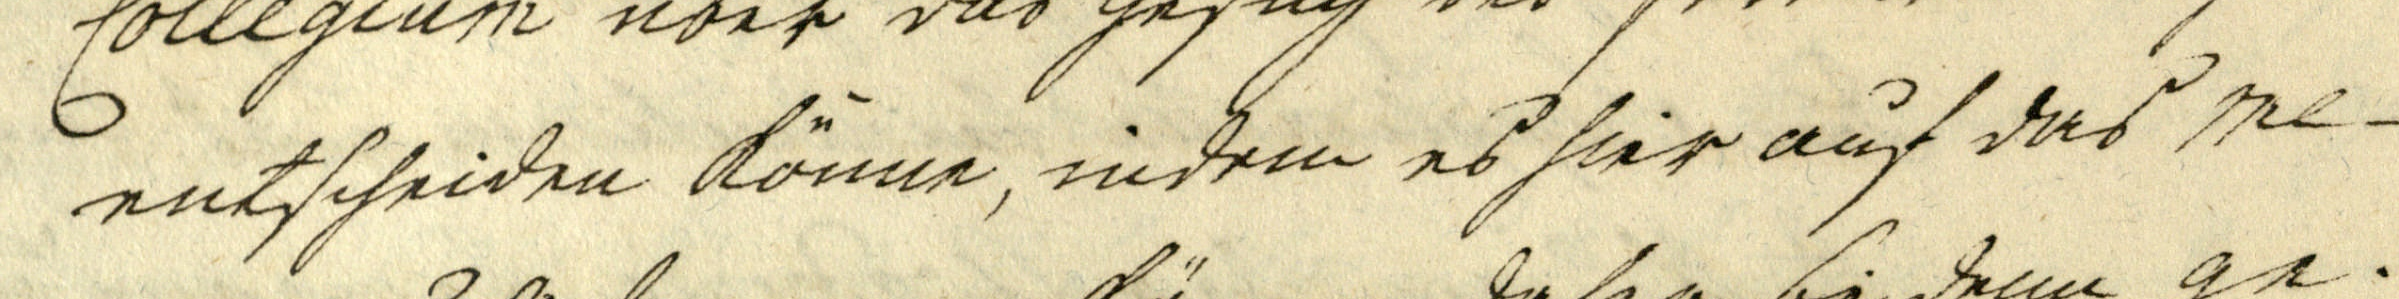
entscheiden könne, indem es hier auf das me¬
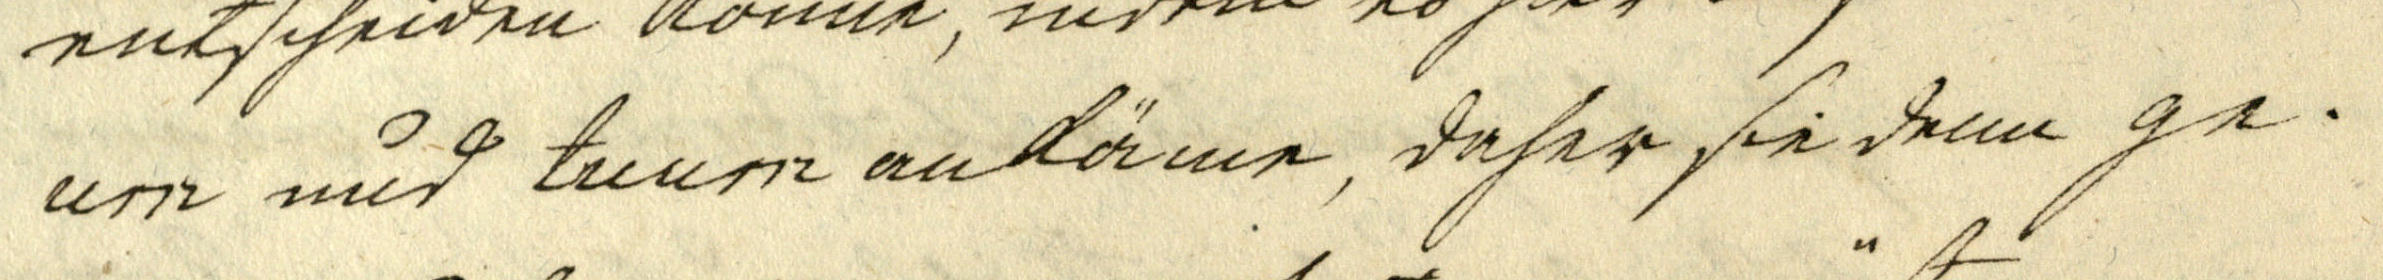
um und tuum ankäme, daher sie denn ge¬
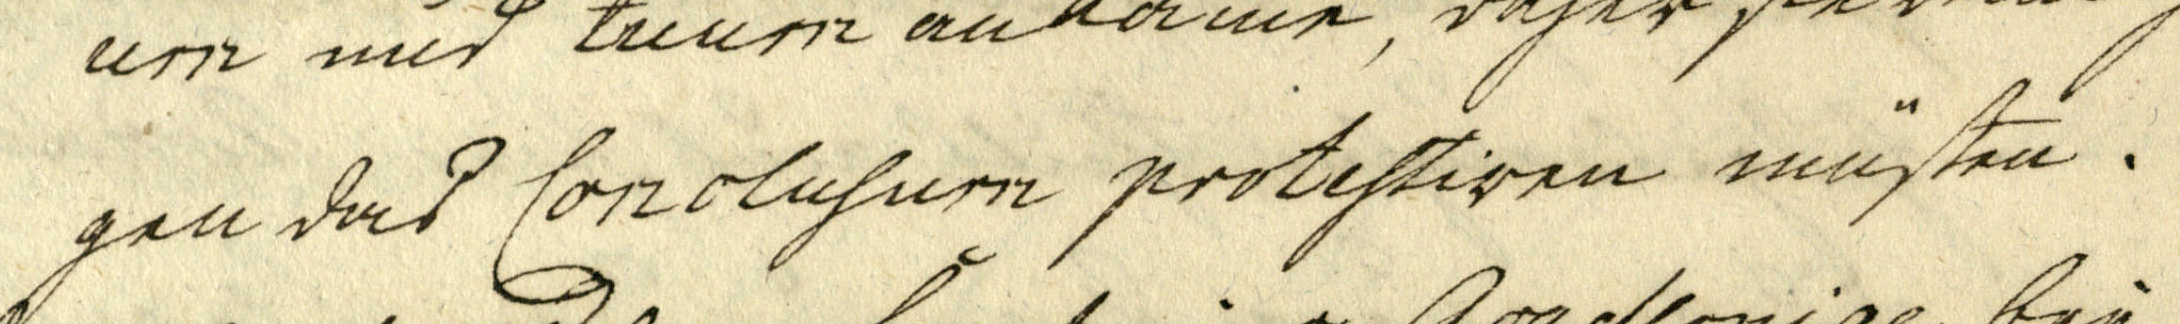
gen das Conclusum protestiren müßten.
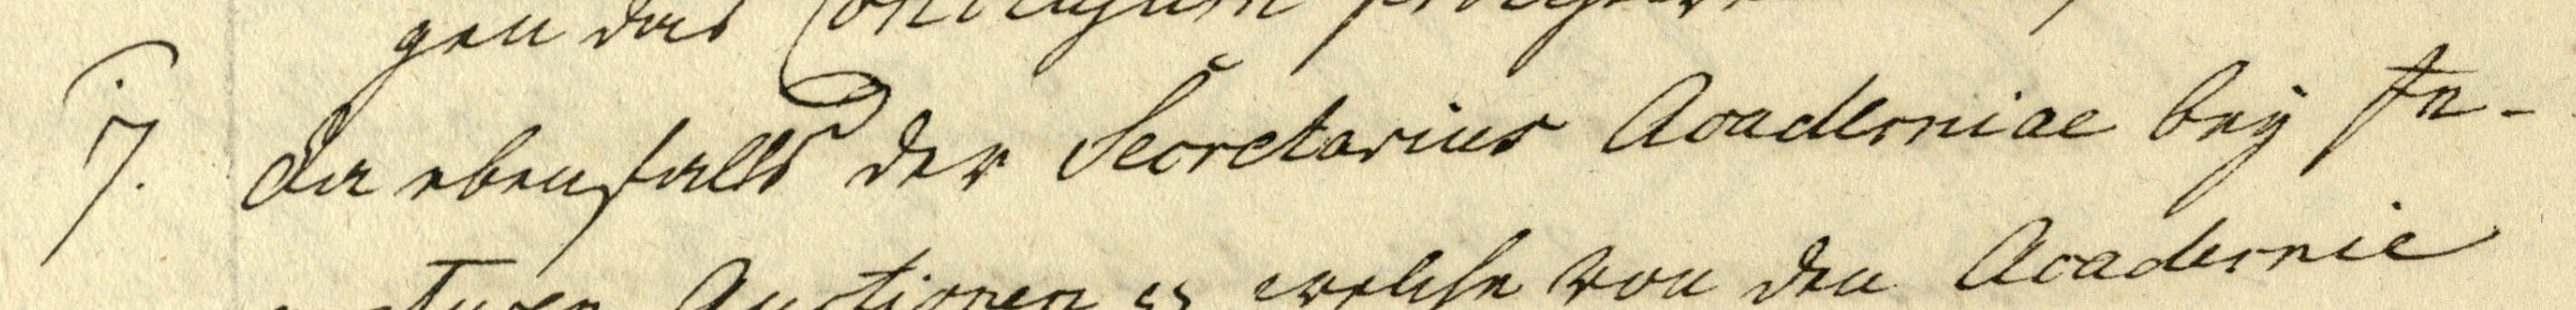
7. Da ebenfalls der Secretarius Academiae bey In¬
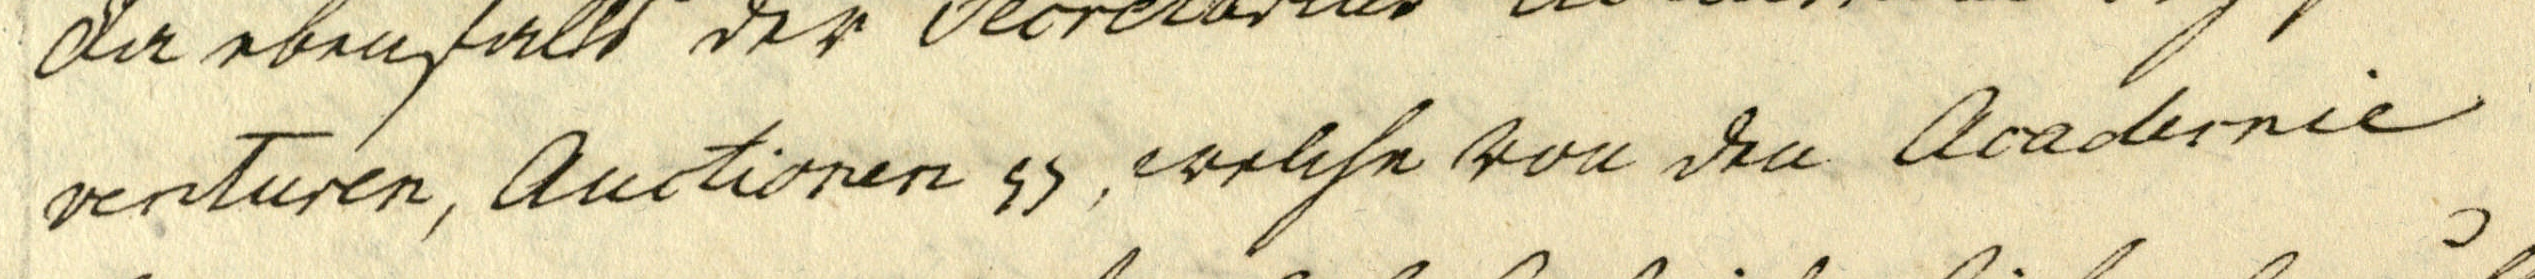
venturen, Auctionen, welche von den Academie
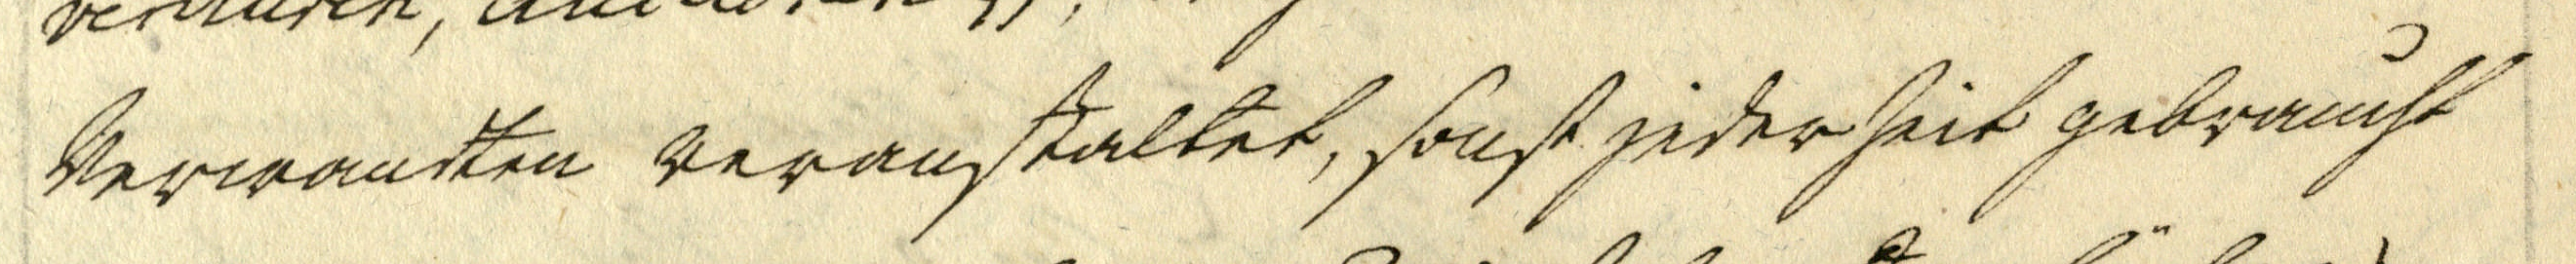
Verwandten veranstaltet, sonst jeder Zeit gebraucht
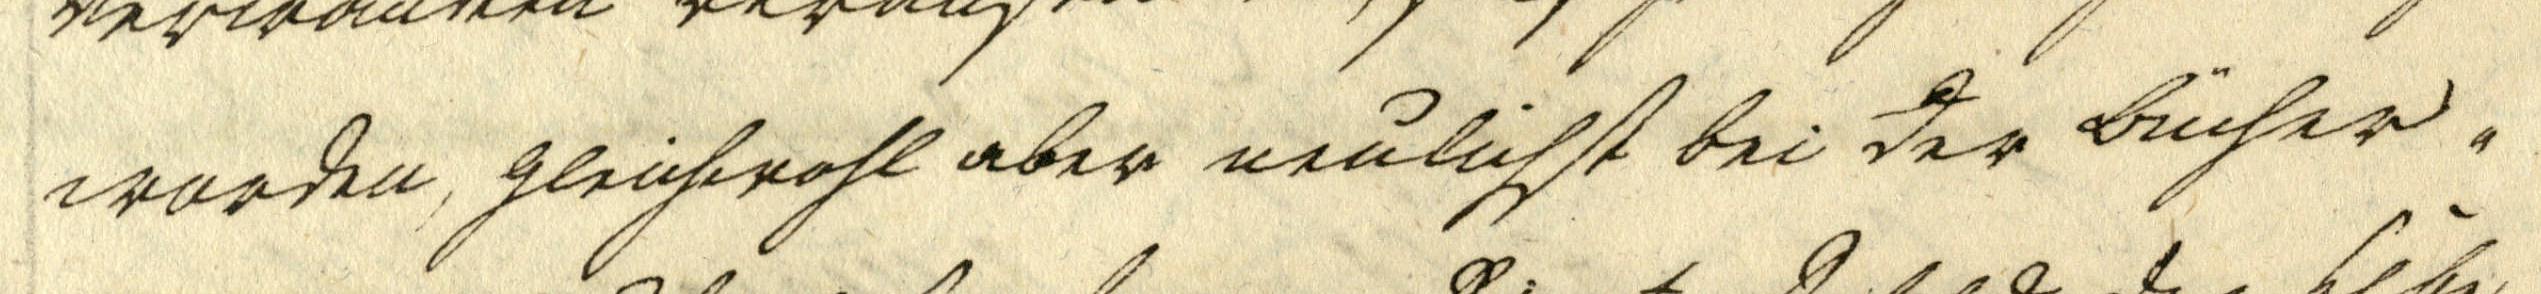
worden, gleichwohl aber neulichst bei der Bücher¬
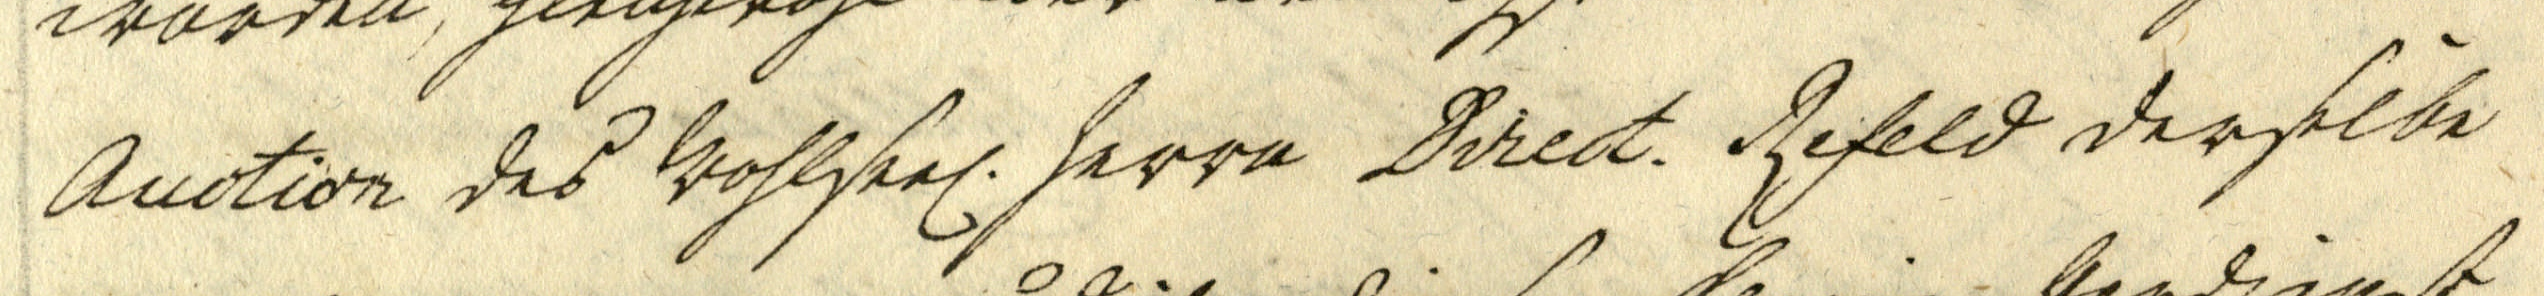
Auction des Wohlseel. Herrn Direct. Refeld derselbe
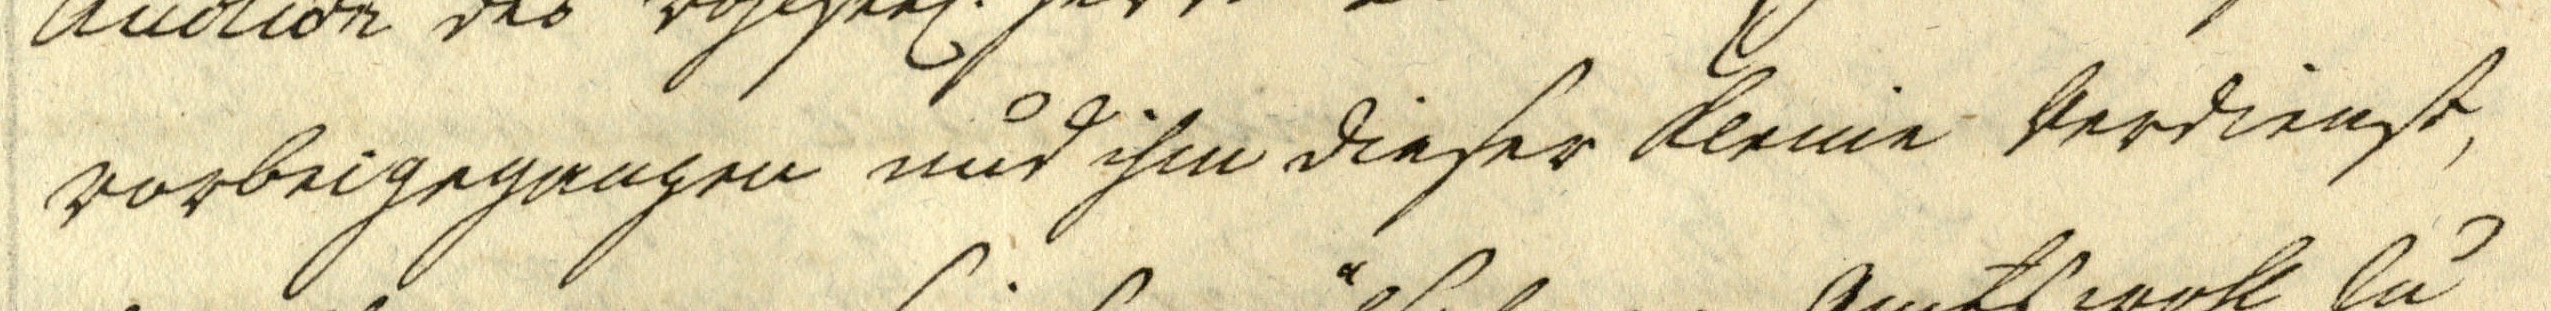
vorbeigegangen und ihm dieser kleine Verdienst,
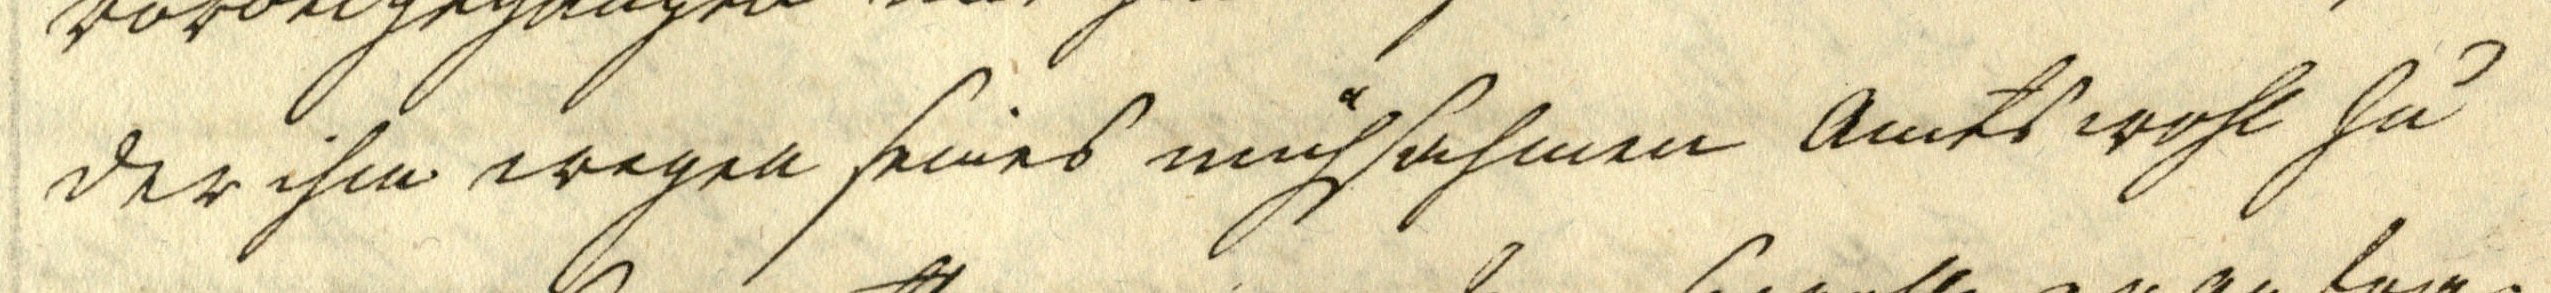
der ihm wegen seines mühsahmen Amts wohl zu
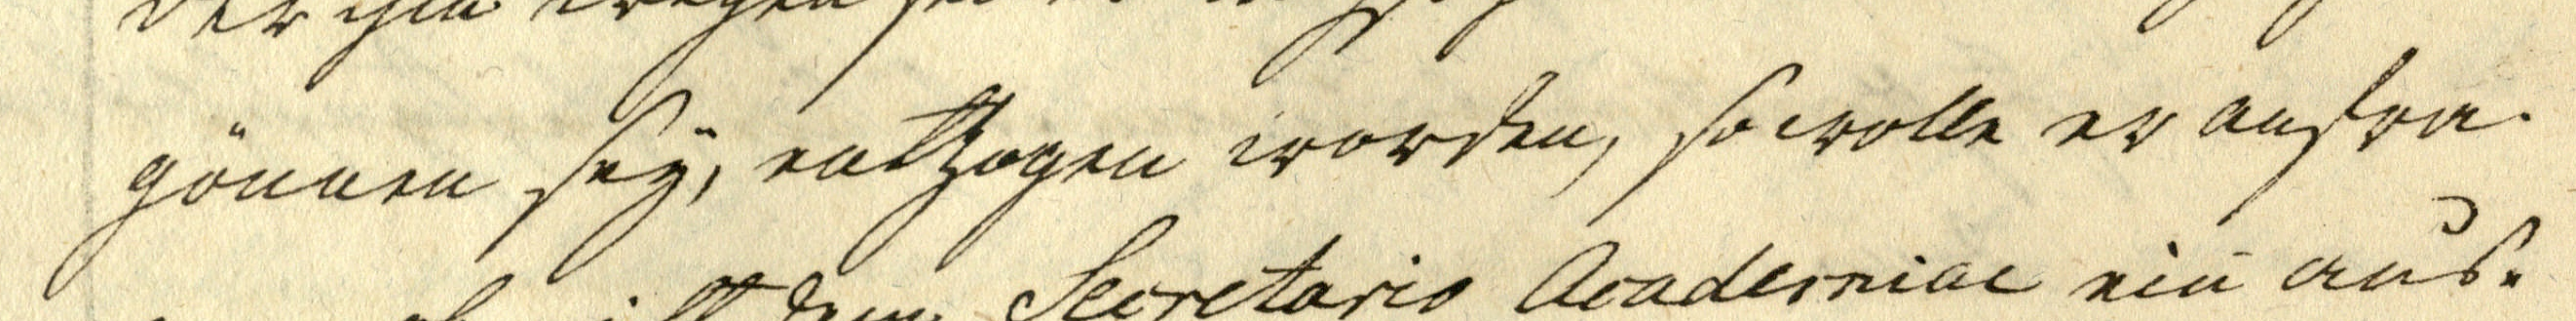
gönnen seÿ, entzogen worden, so wolle er anfra¬
